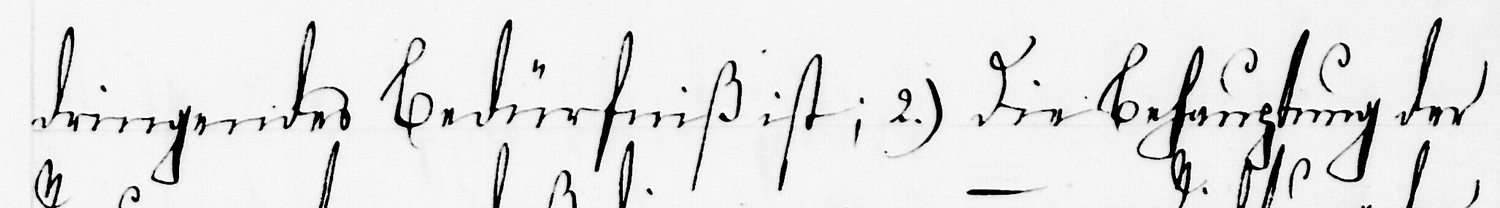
dringendes Bedürfniß ist; 2.) Die Behauptung der
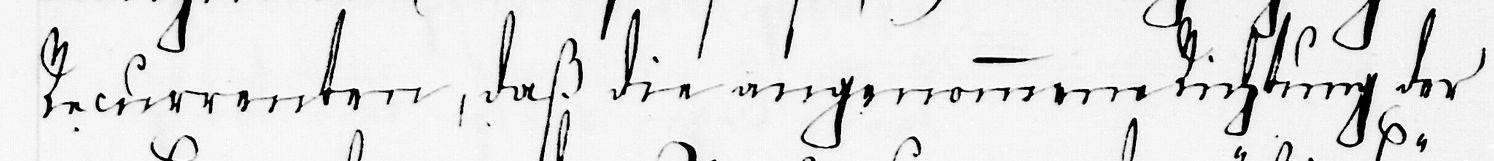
Recurrenten, daß die angenommene Richtung der
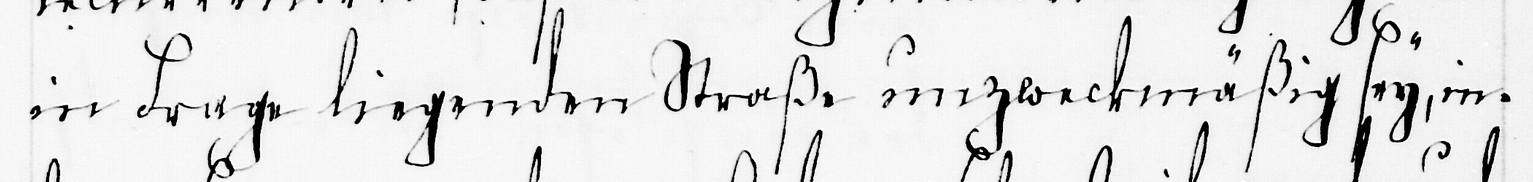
in Frage liegenden Straße unzweckmäßig sey, in¬
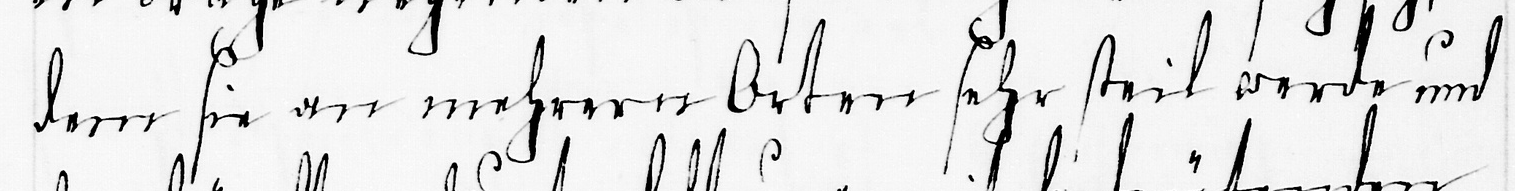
dem sie an mehrern Orten sehr steil werde und
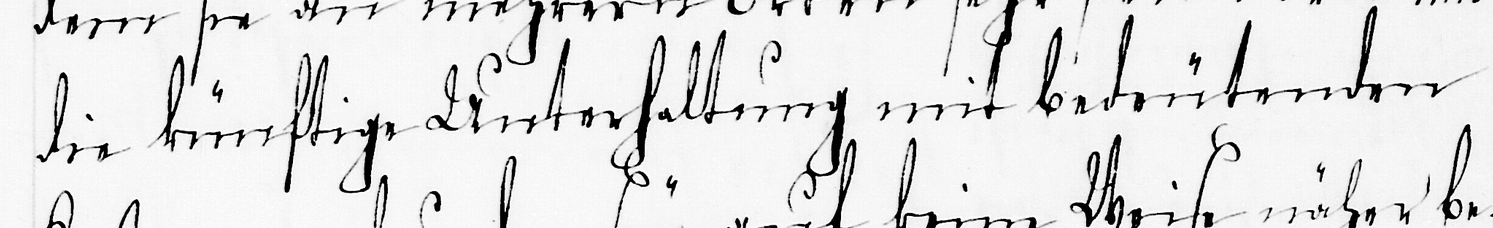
die künftige Unterhaltung mit bedeutenden
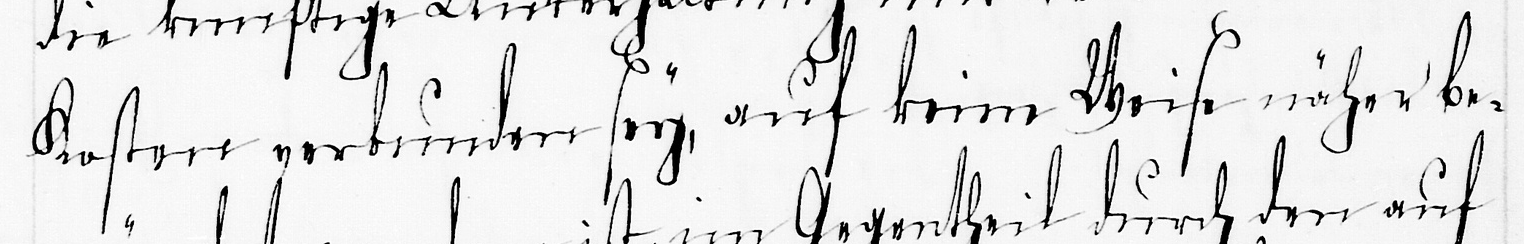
Kosten verbunden sey, auf keine Weise näher be¬
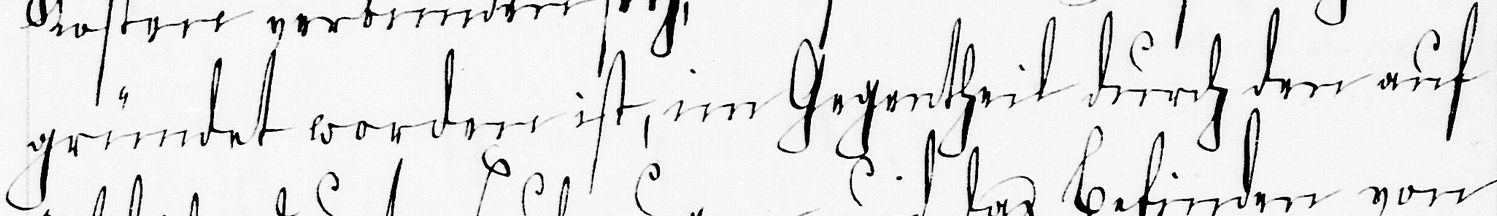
gründet worden ist, im Gegentheil durch den auf
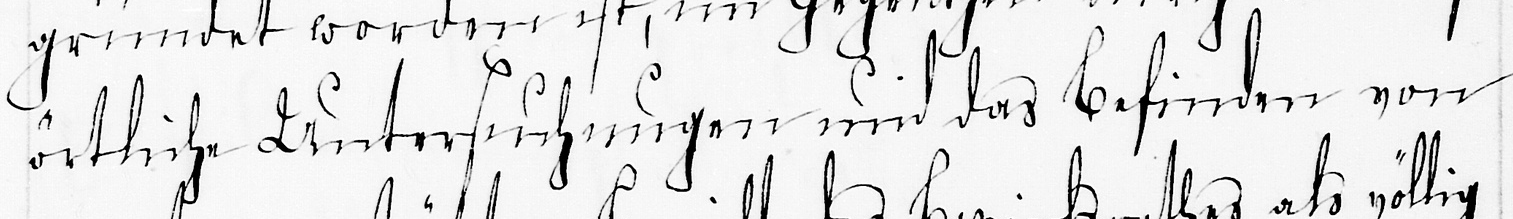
örtliche Untersuchungen und das Befinden von
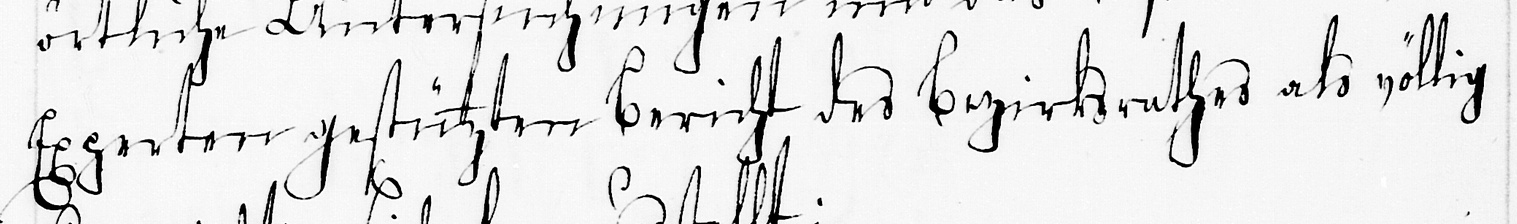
Experten gestützten Bericht des Bezirksrathes als völlig
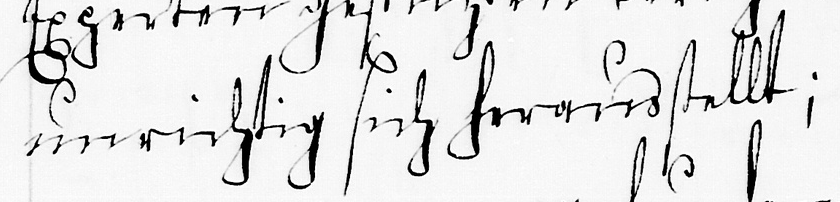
unrichtig sich herausstellt;
